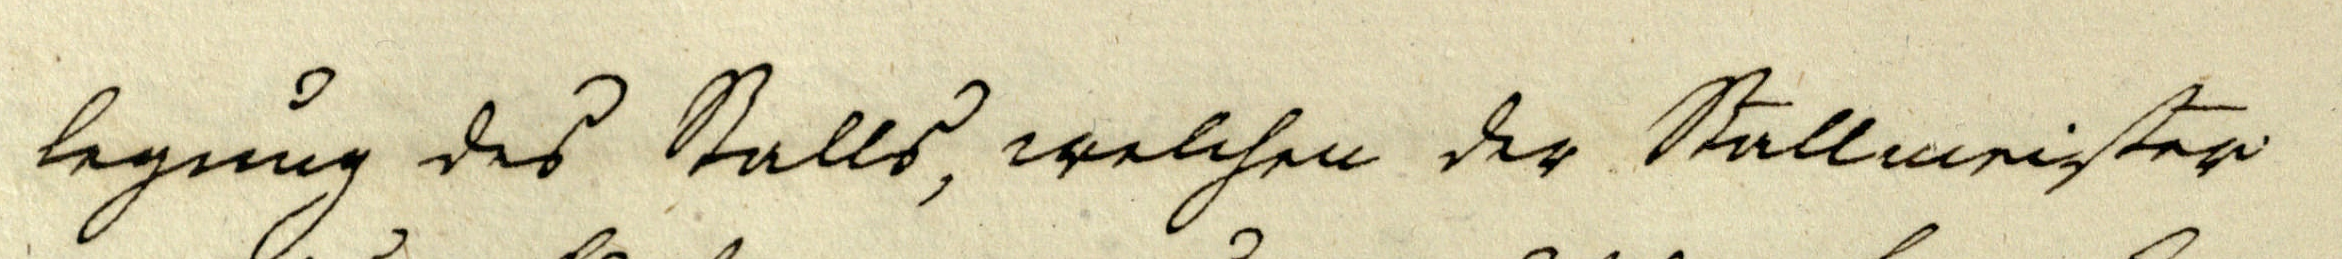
legung des Stalls, welchen der Stallmeister
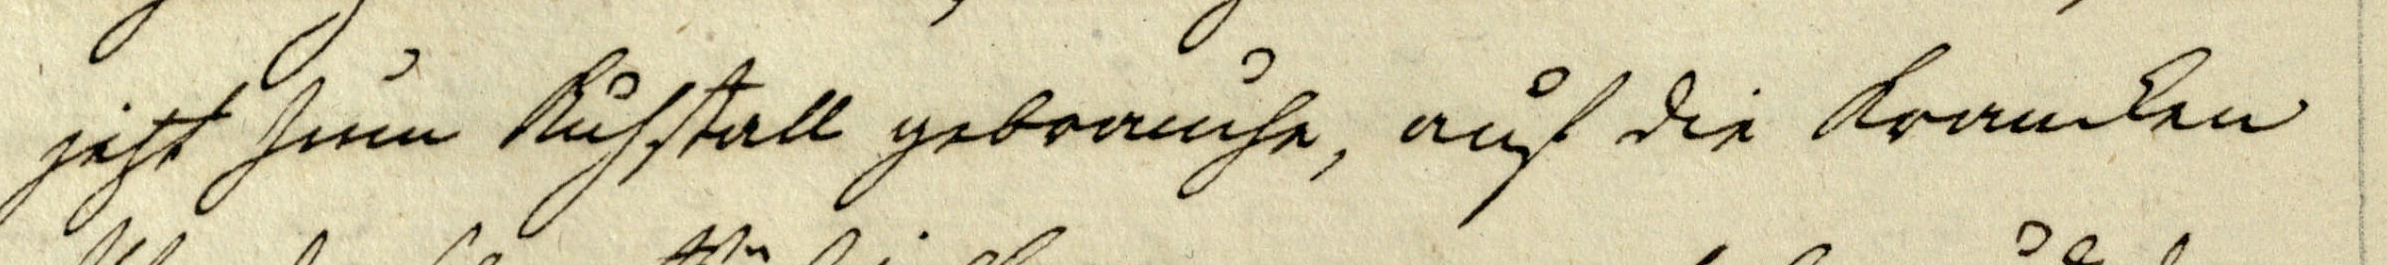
jetzt zum Kuhstall gebrauche, auf die krancken
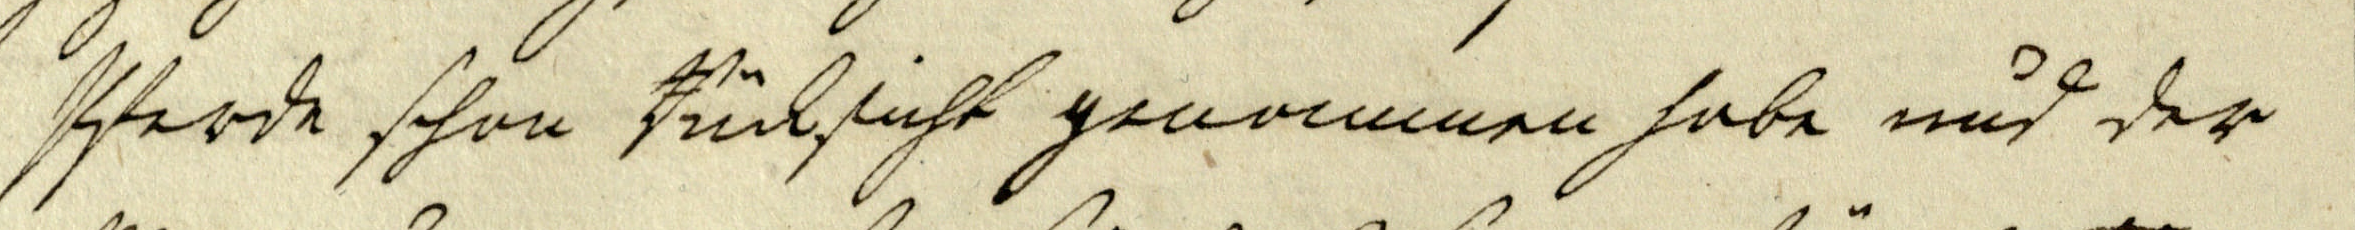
Pferde schon Rücksicht genommen habe und der
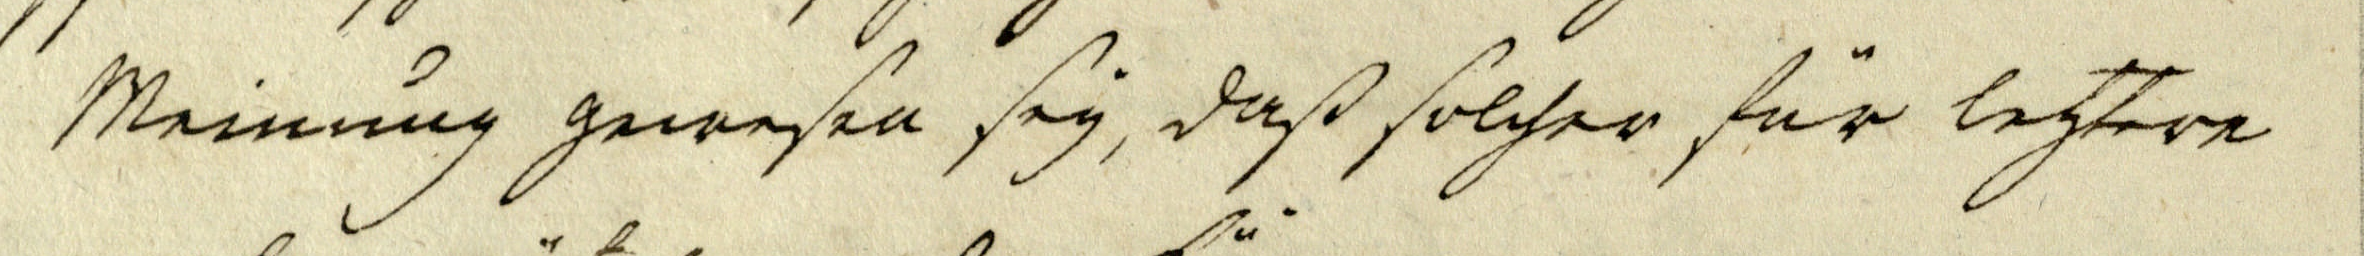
Meinung gewesen seÿ, daß solcher für letztere
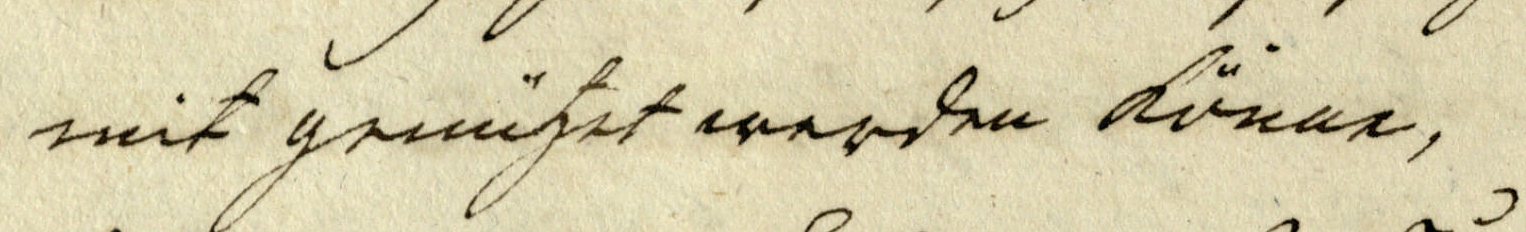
mit genützet werden könne,
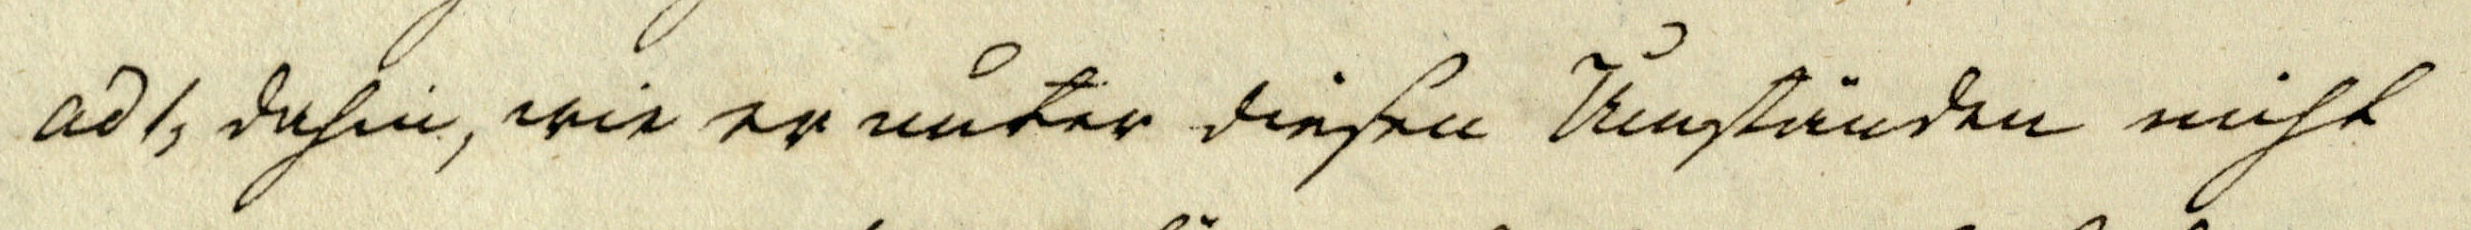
ad 1, dahin, wie er unter diesen Umständen nicht
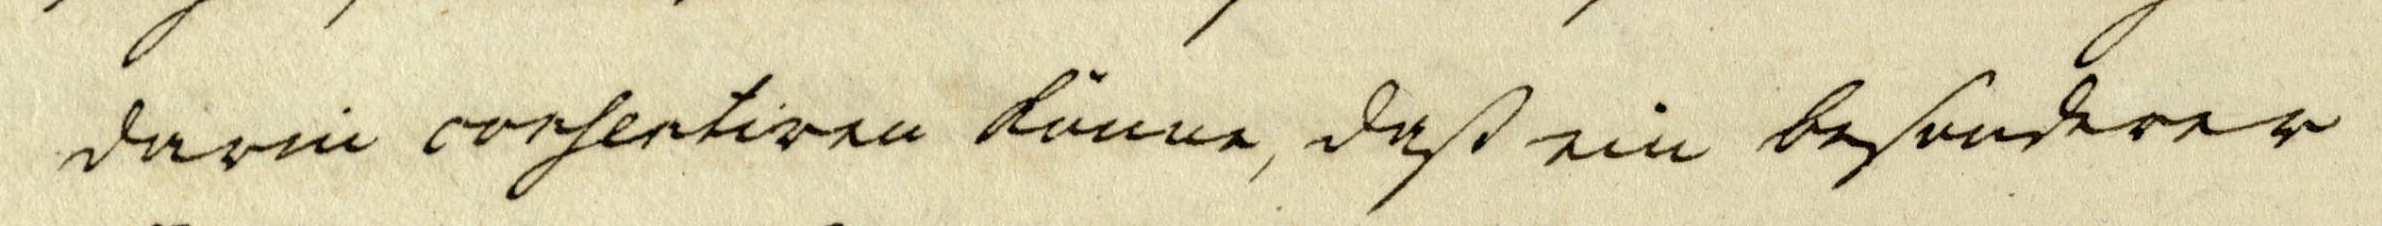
darin consentiren könne, daß ein besonderer
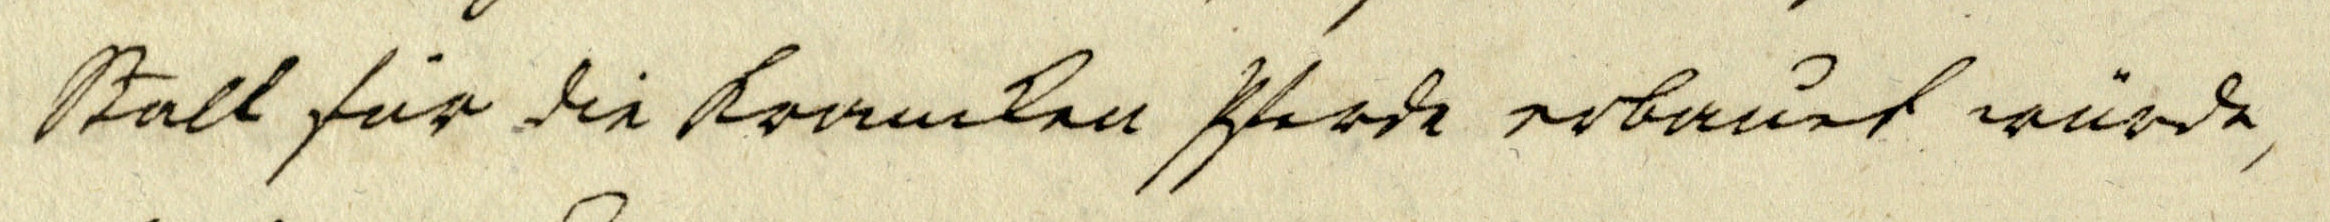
Stall für die krancken Pferde erbauet würde,
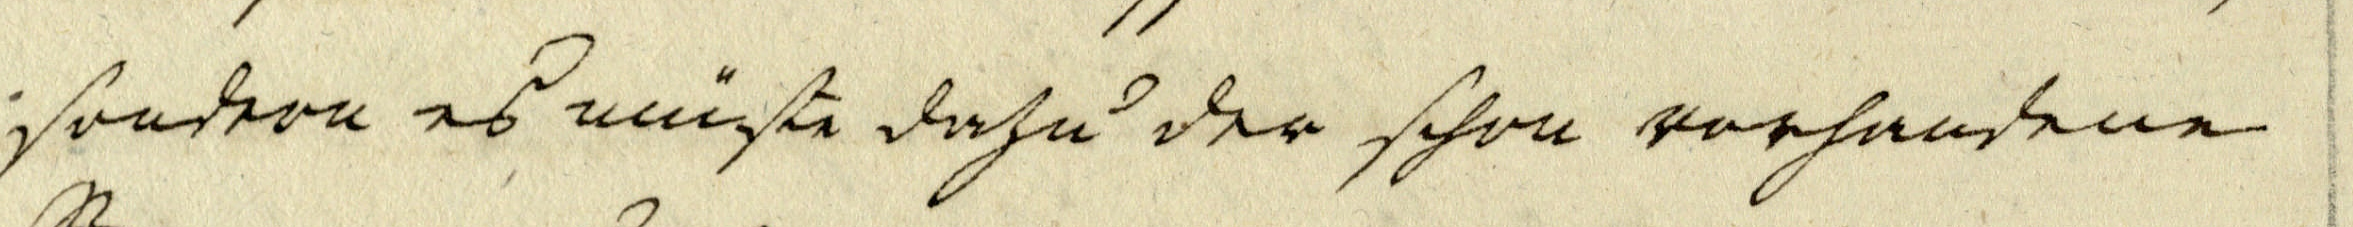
sondern es müßte dazu der schon vorhandene
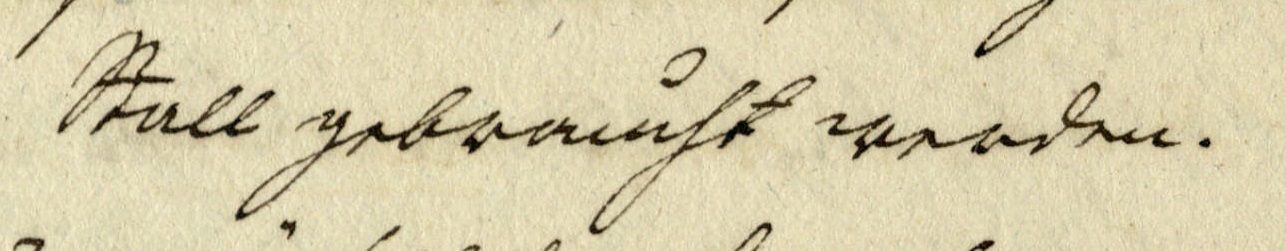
Stall gebraucht werden.
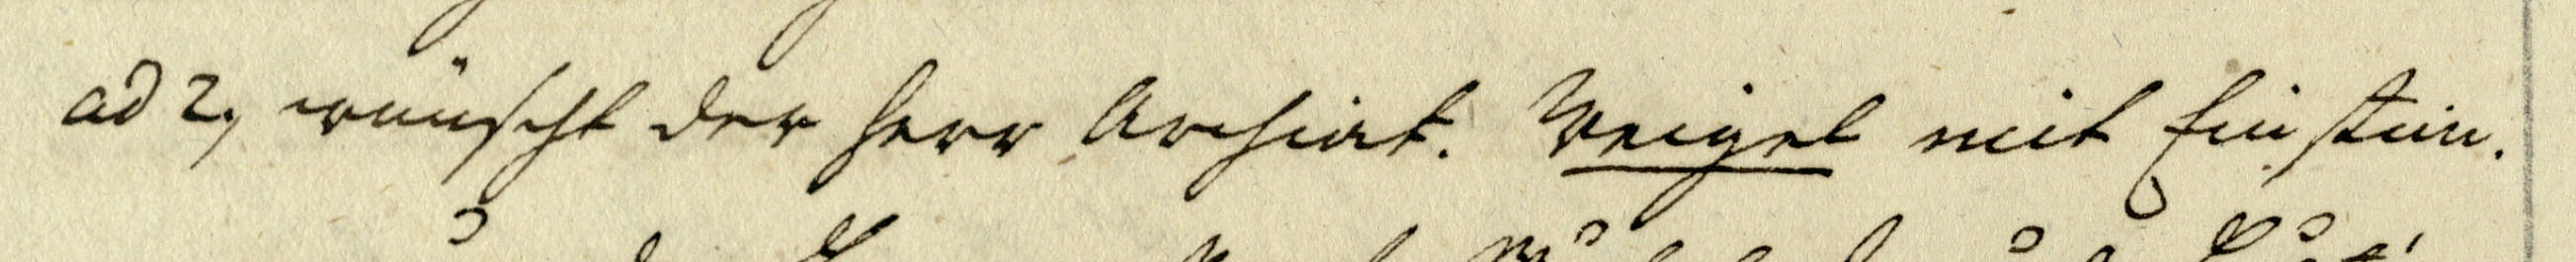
ad 2., wünscht der Herr Archiat. Weigel mit Einstim¬
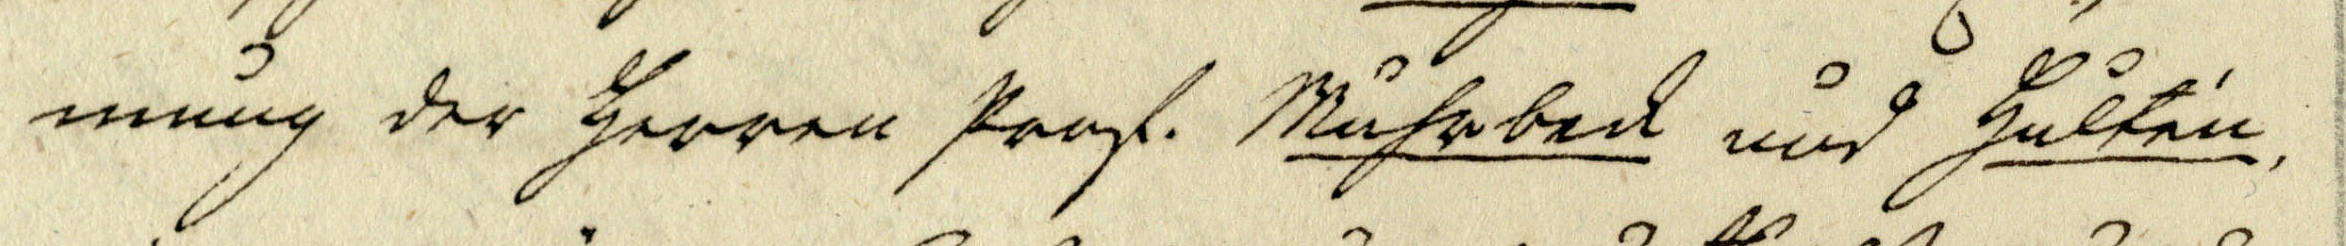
mung der Herren Prof. Muhrbeck und Hultén,
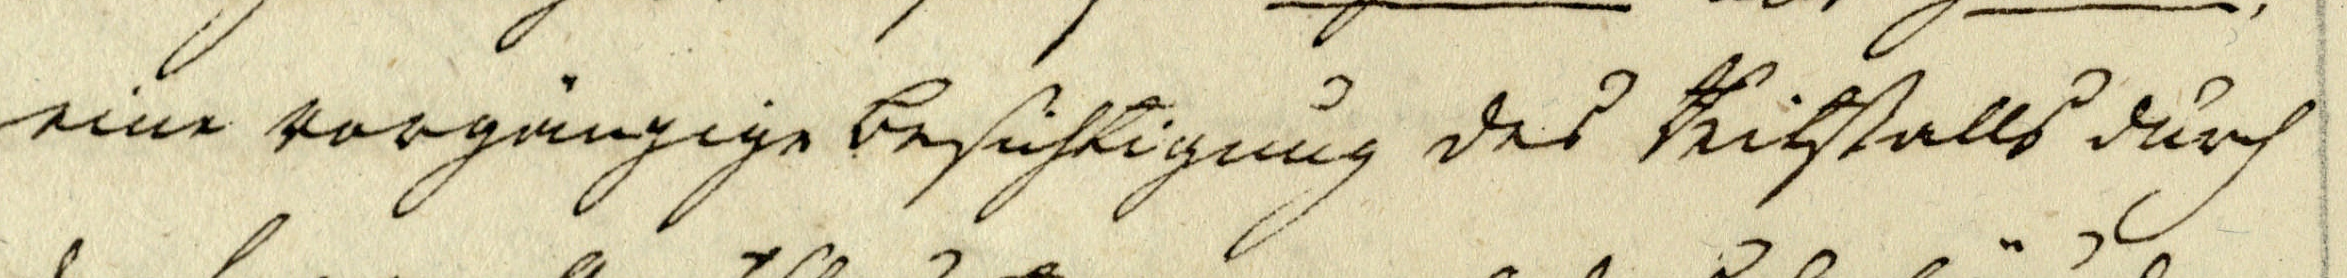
eine vorgängige Besichtigung des Reitstalls durch
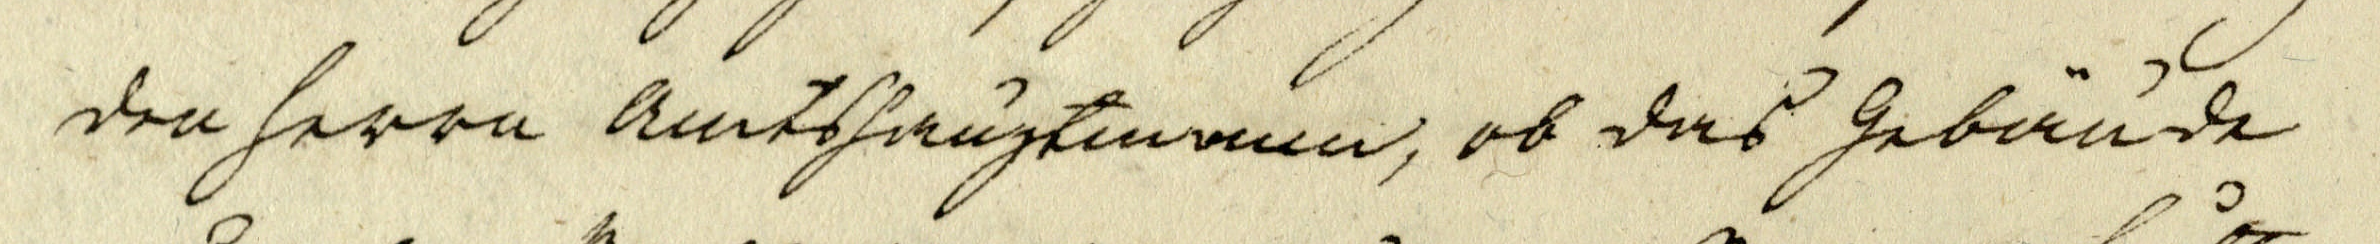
den Herrn Amtshauptmann, ob das Gebäude
